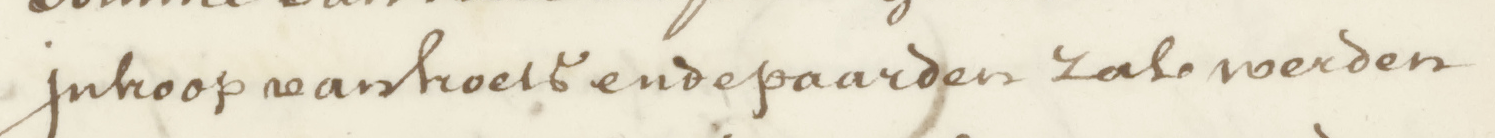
inkoop van koets ende paarden zal werden
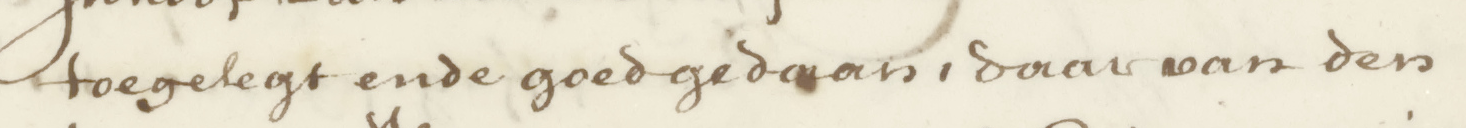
toegelegt ende goedgedaan, daar van den
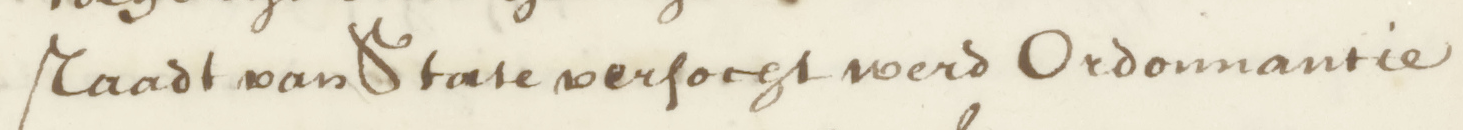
Raadt van State versocht werd Ordonnantie
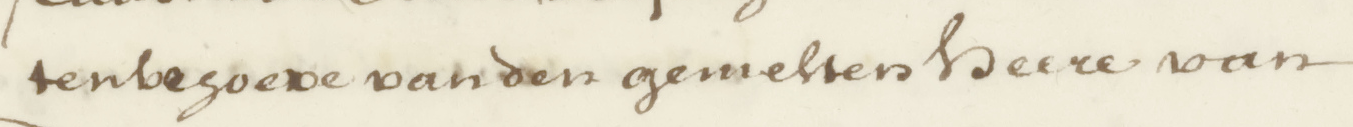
ten behoeve vanden gemelten heere van
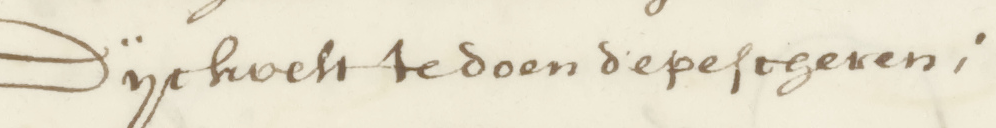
Dijckvelt te doen depescheren;
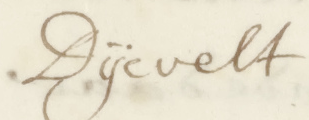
Dijcvelt
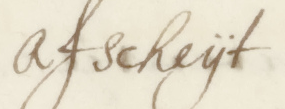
afscheijt
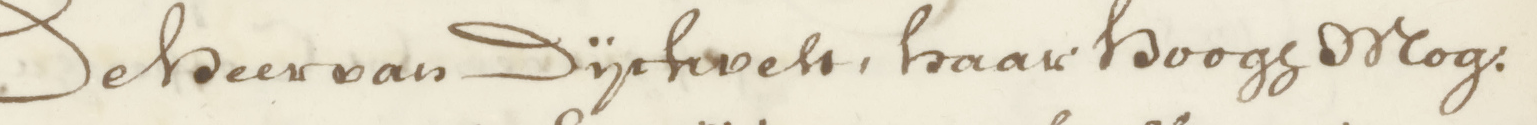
De heer van Dijckvelt, haar Hoogh Mog:
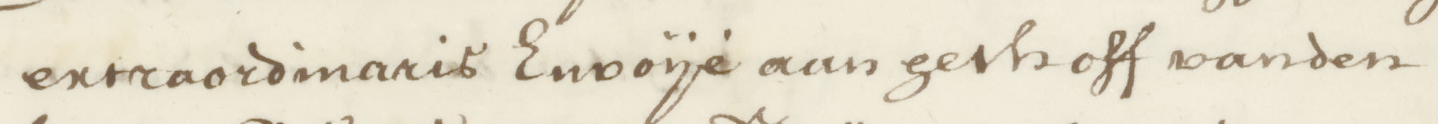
extraordinaris Envoijé aan het hoff vanden
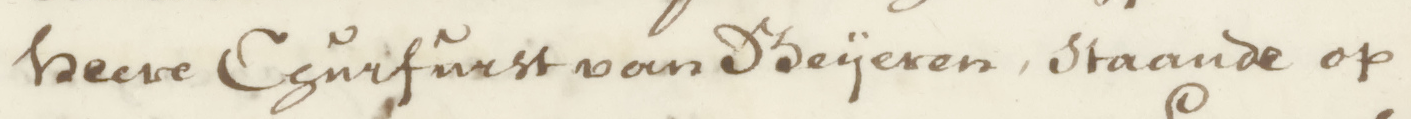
heere Churfurst van Beijeren, staande op
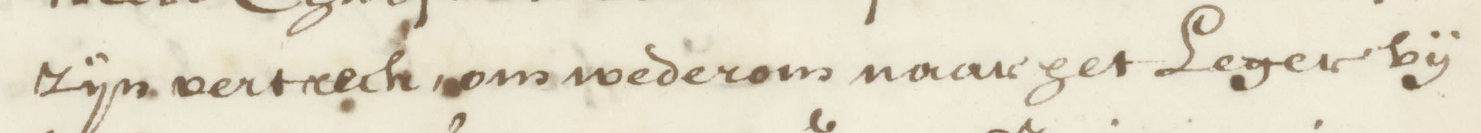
zijn vertreck, om wederom naar het Leger bij
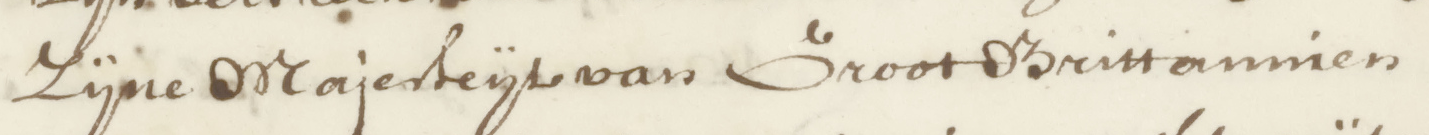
Zijne Majesteijt van Groot Brittanien
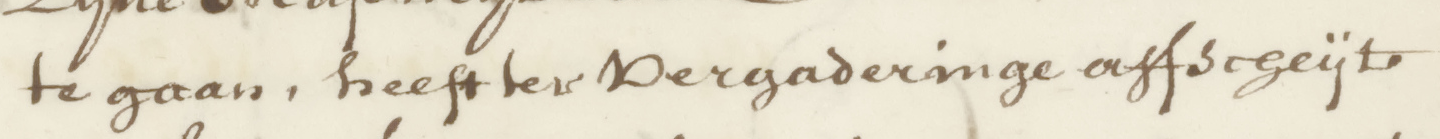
te gaan, heeft ter Vergaderinge affscheijt
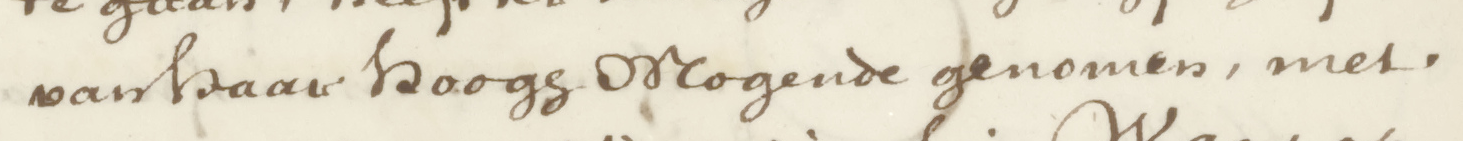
van Haar Hoogh Mogende genomen, met
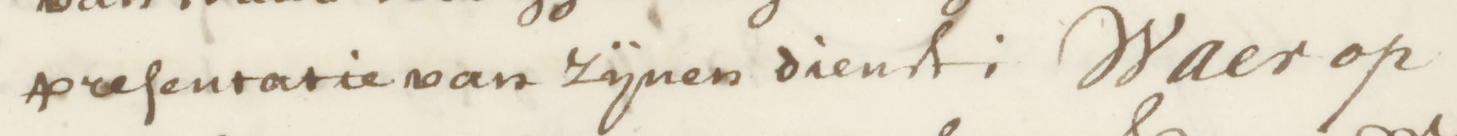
presentatie van zijnen dienst: Waer op
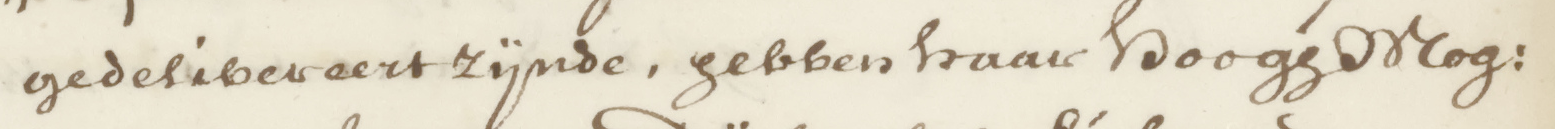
gedelibereert zijnde, hebben haar Hooge Mog:
